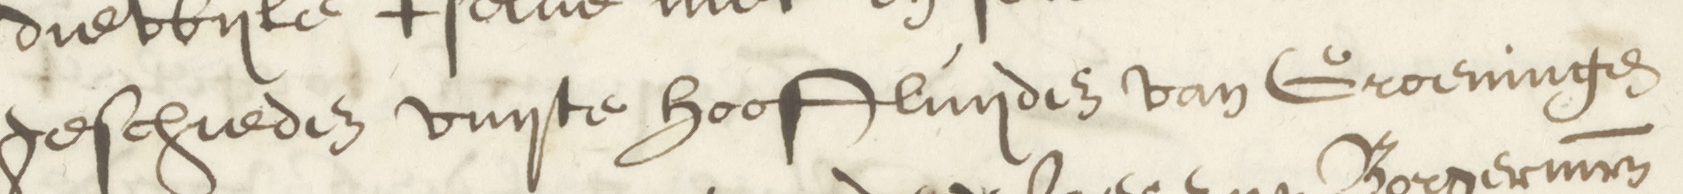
geschieden uuyte hooftluyden van Groeningen
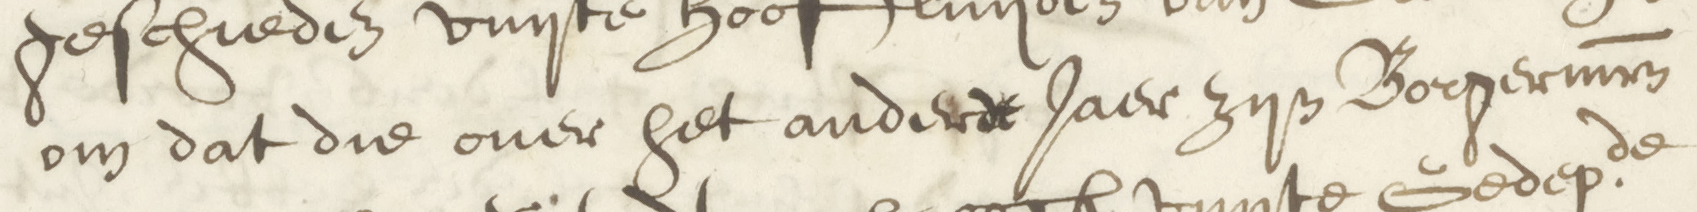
om dat die ouer het anderde jaer zyn Borgermrn
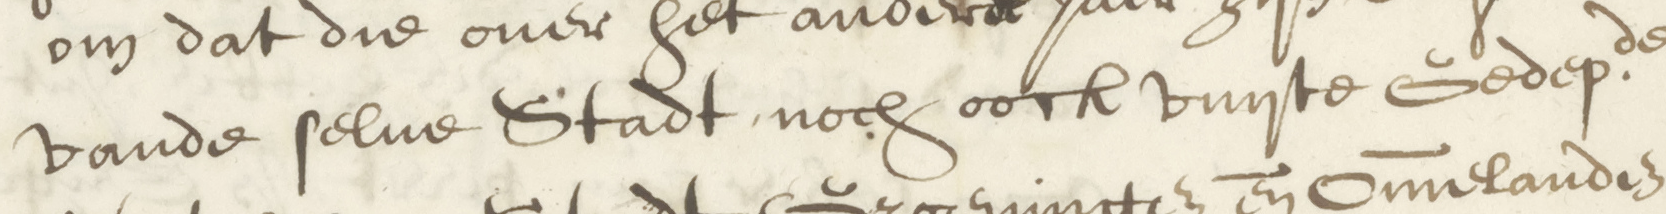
vande selue Stadt, noch oock vuijte Gedepde.
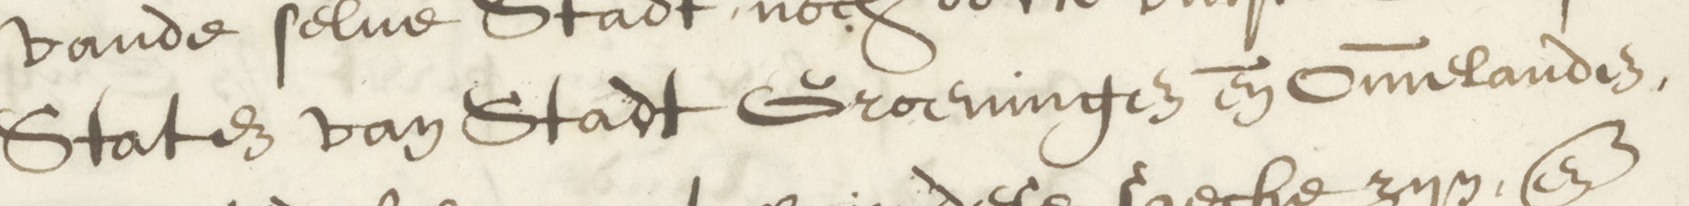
Staten van Stadt Groeningen en Omelanden,
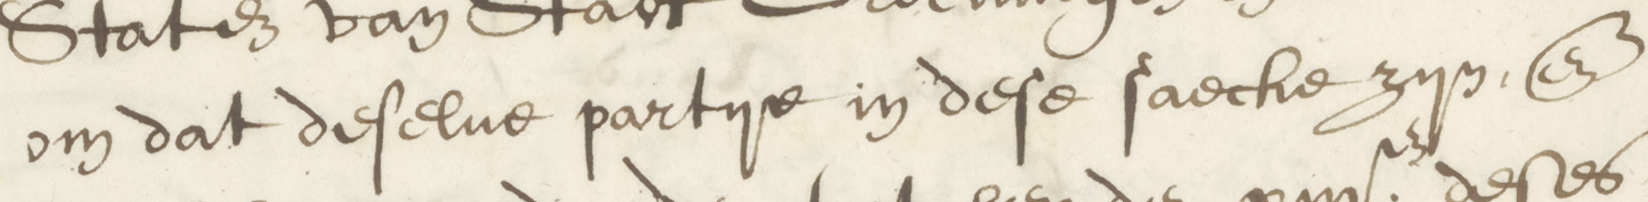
om dat deselue partye in dese saecke zijn, &
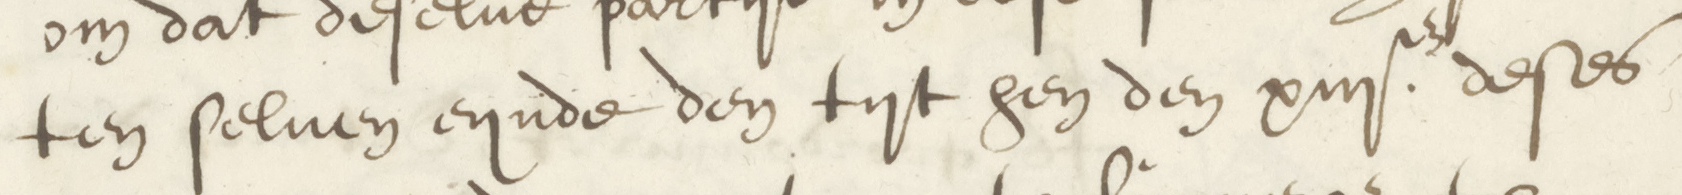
ten seluen eynde den tyt hen den xiije. deses
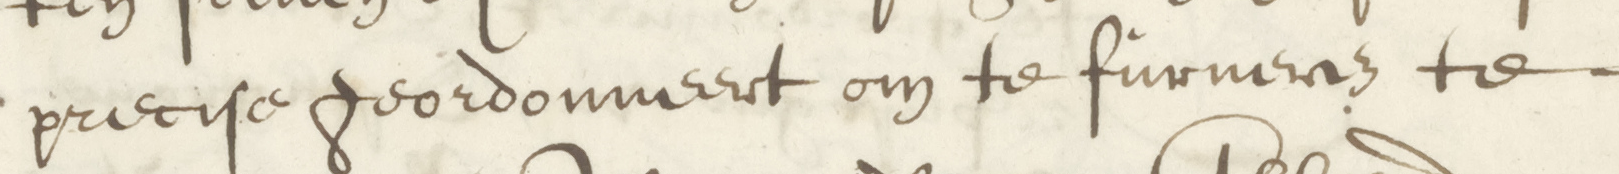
precise geordonneert om te furneren te
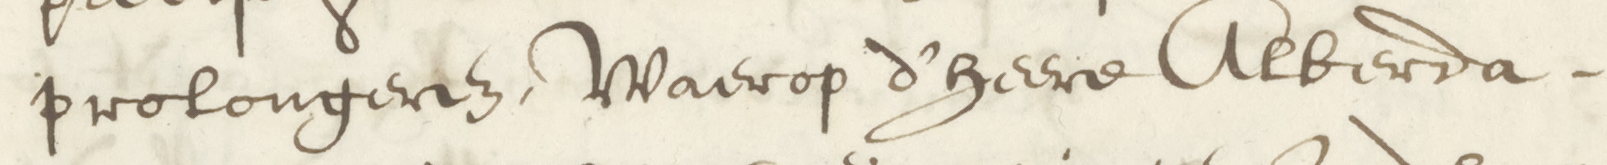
prolongeren. Waerop d'heere Alberda
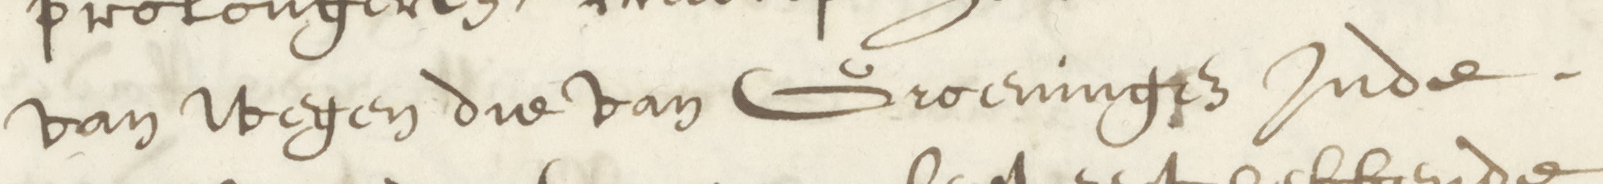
van Wegen die van Groeningen Inde
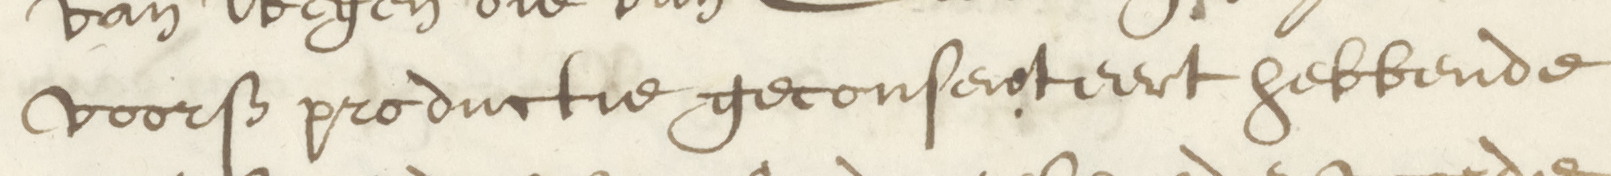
voors productie geconsenteert hebbende
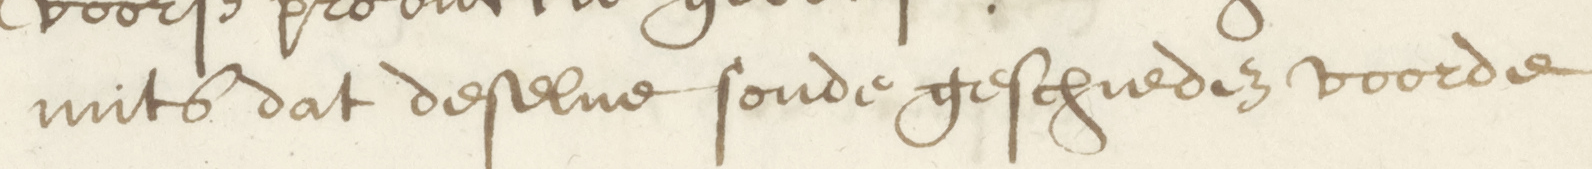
mits dat deselue soude geschieden voorde
